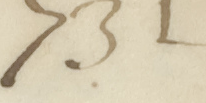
731
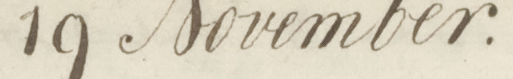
19 November.
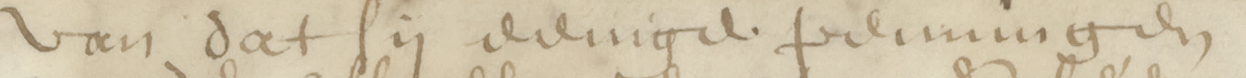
van dat sij eenige penningen
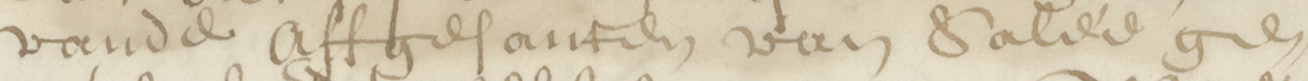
vande affgesanten van Salée ge,,
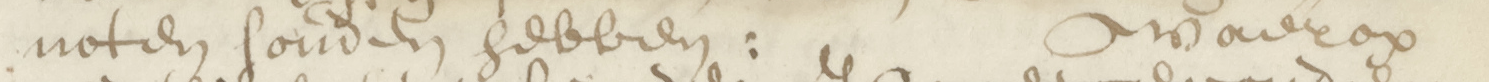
noten souden hebben: Waerop
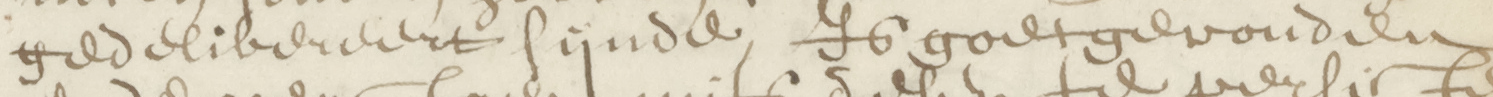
gedelibereert sijnde, Is goetgevonden
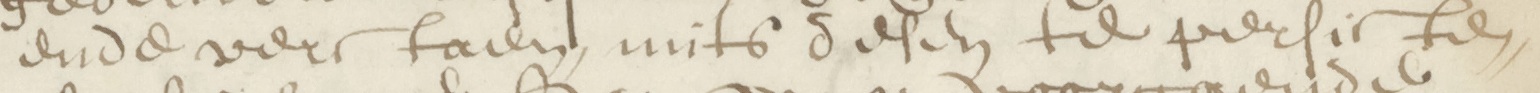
ende verstaen, mits desen te persiste,,
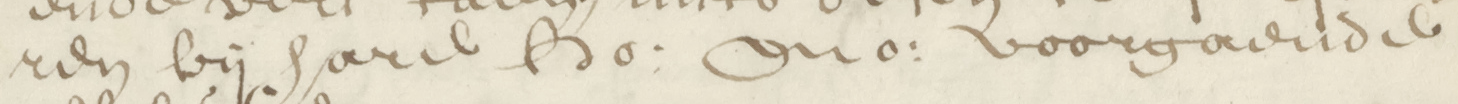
ren bij hare Ho:Mo: voorgaende
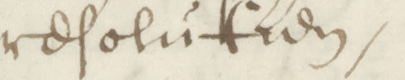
resolutien.
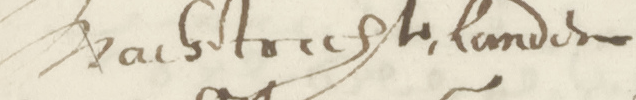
Maestricht, Landen
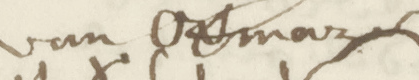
van Ovmaze
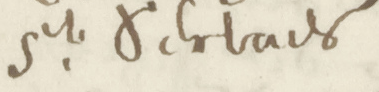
St. Servaes
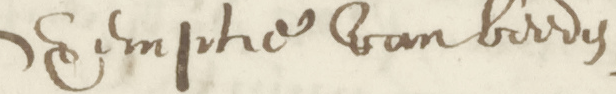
Exemptie van beeden
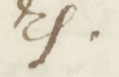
rs.
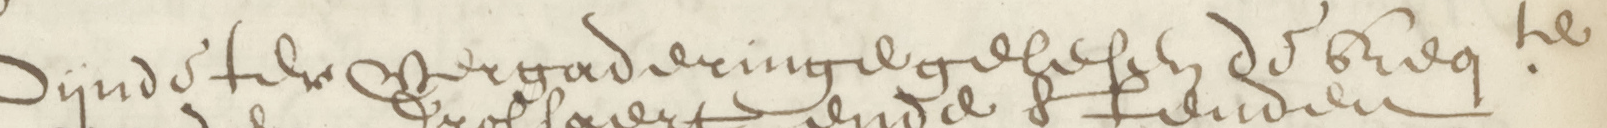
Sijnde ter Vergaderinge gelesen de Reqte.
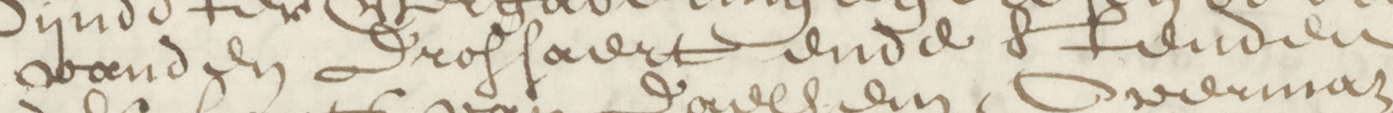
van den Drossaert ende Stenden
